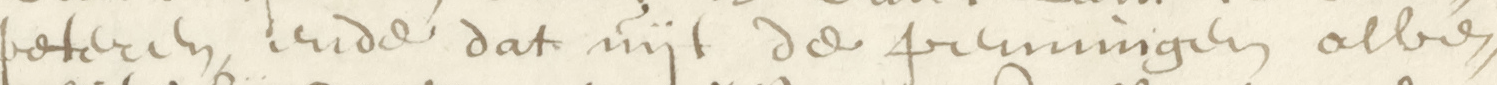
peteren, ende dat uijt de penningen albe„
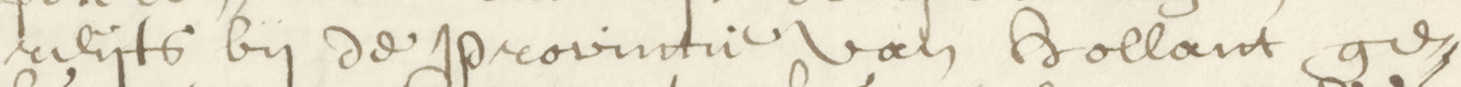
reijts bij de Provintie van Hollant ge„
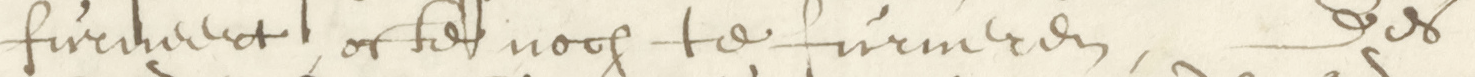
furneert, ofte noch te furneren. Des
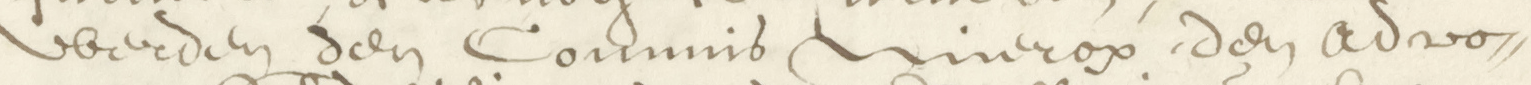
werden den Commis Mierop, den Advo„
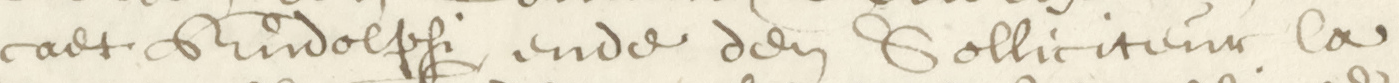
caet Rudolpsi, ende den Solliciteur la
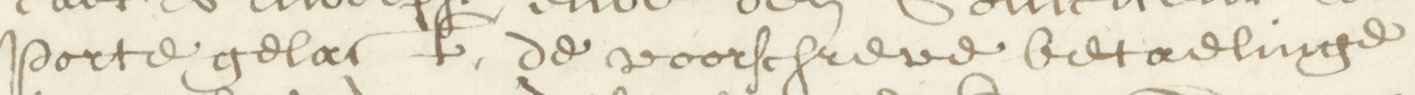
Porte gelast, de voorschreve betaelinge
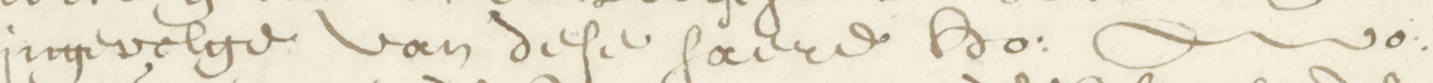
ingevolge van dese haere Ho:Mo:
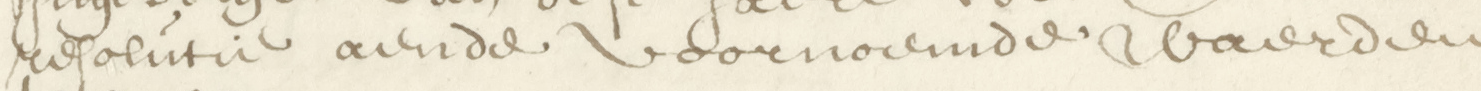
resolutie aende voornoemde Waerden
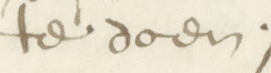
te doen;
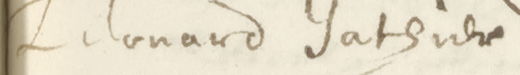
Leonard Gathier
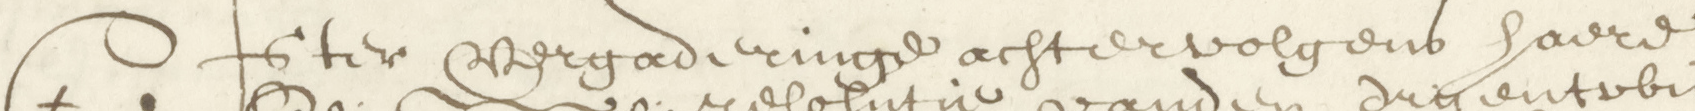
Is ter Vergaderinge achtervolgens haere
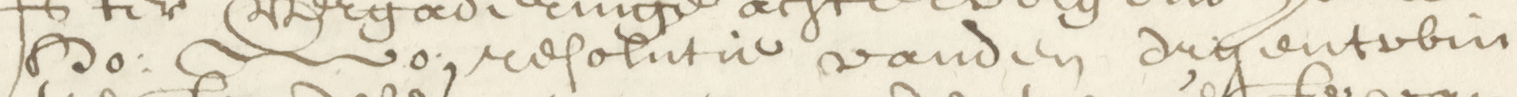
Ho:Mo: resolutie vanden drijentwin„
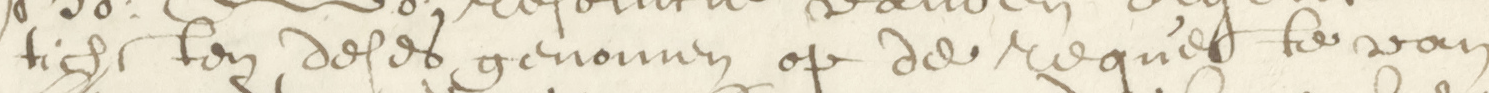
tichsten deses genomen op de request van
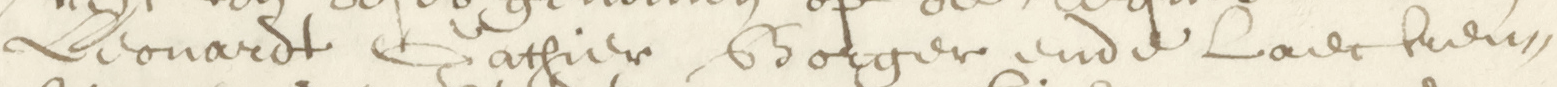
Leonardt Gathier, Borger ende Laecken„
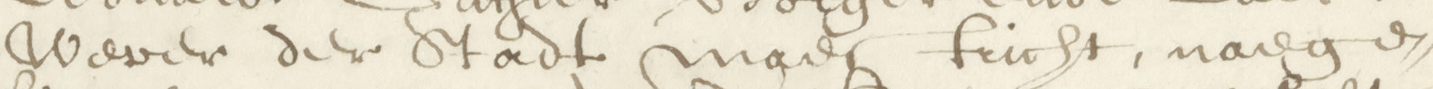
Wever der Stadt Maestricht, naege„
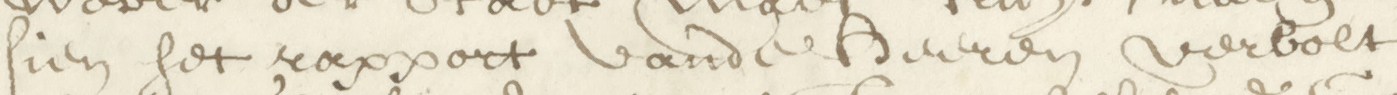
sien het rapport vande Heeren Verbolt
